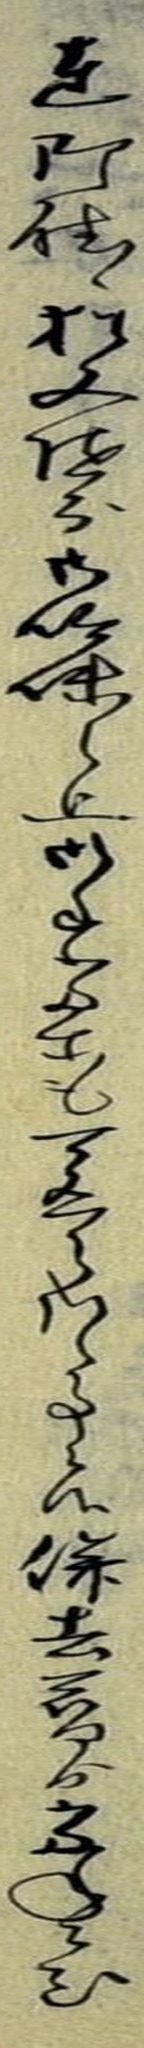達御聴候猶又随分御吟味之上御手当等も可有之哉之事に候併去暮ゟ当年に至
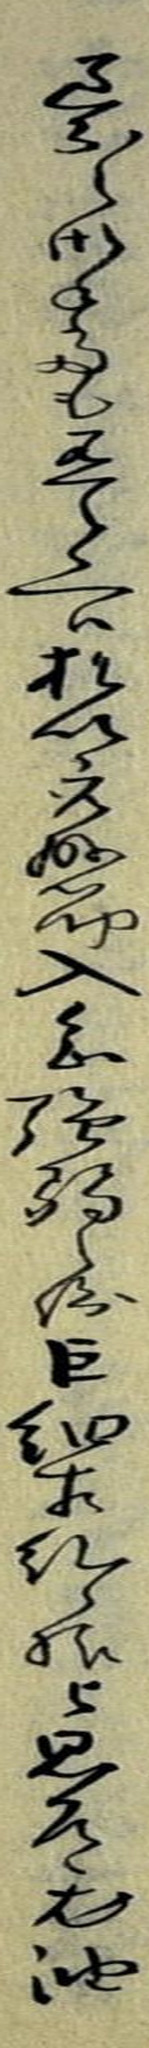過分之御手当も有之候へは猶以取扱筋入念強弱之儀巨細相糺候様被思召候尤油
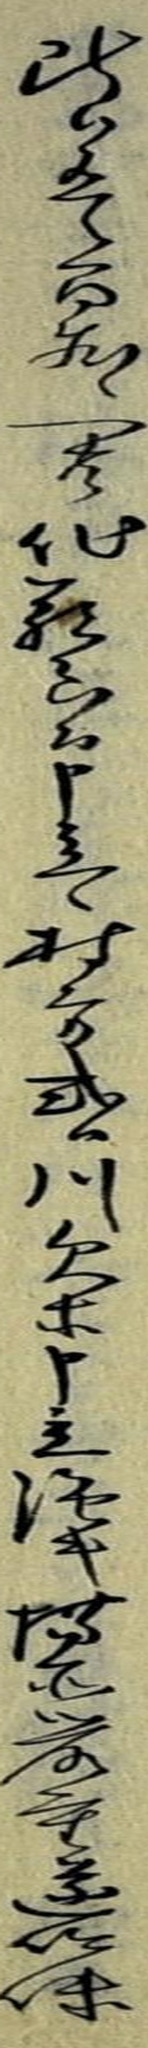断は有之間敷候へ共作難至而申立候村方或は川欠等申立強き場所厳重に遂吟味
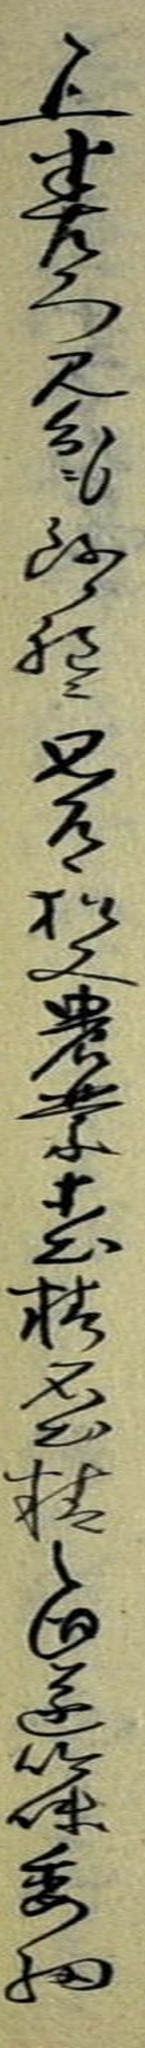候上半左衛門見分も致候程に思召候猶又農業等出精不出精之趣遂吟味委細
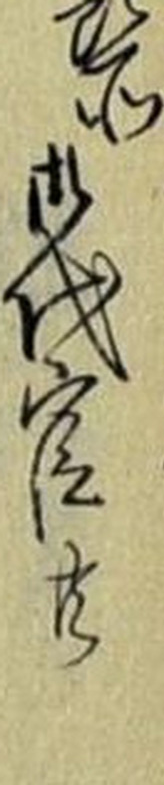御代官共
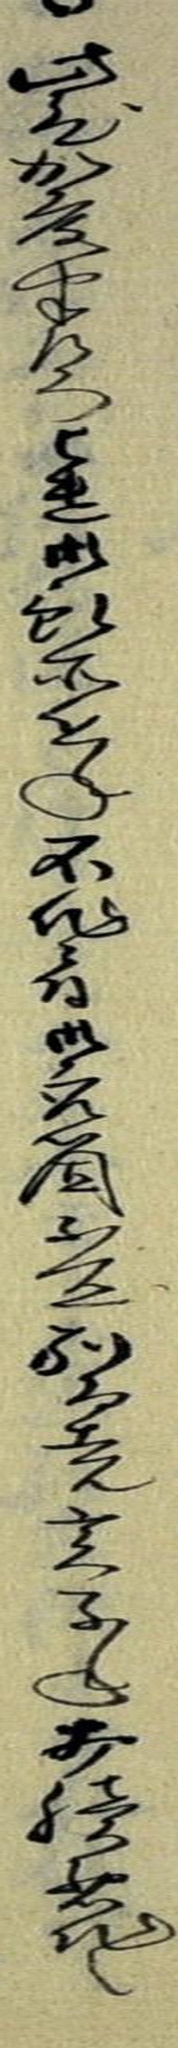〇此度加藤半左衛門被遣御預所近年不作に付御取箇不宜別而去る亥子年打続悪作之
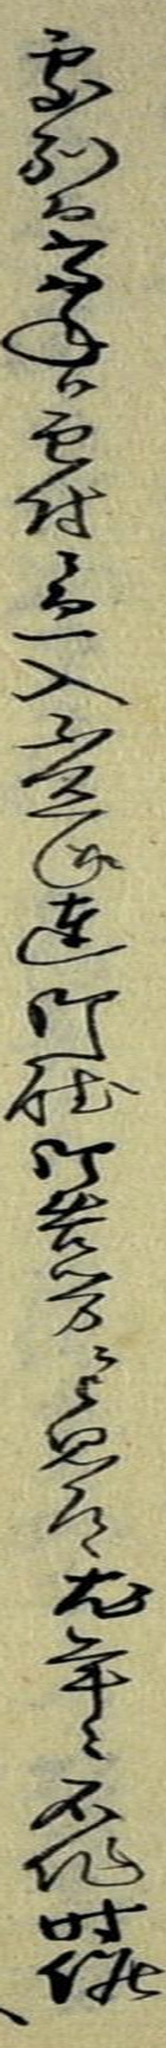処別而当年は毛付に而一入不宜趣達御聴御苦労に被思召候尤年々不作時候
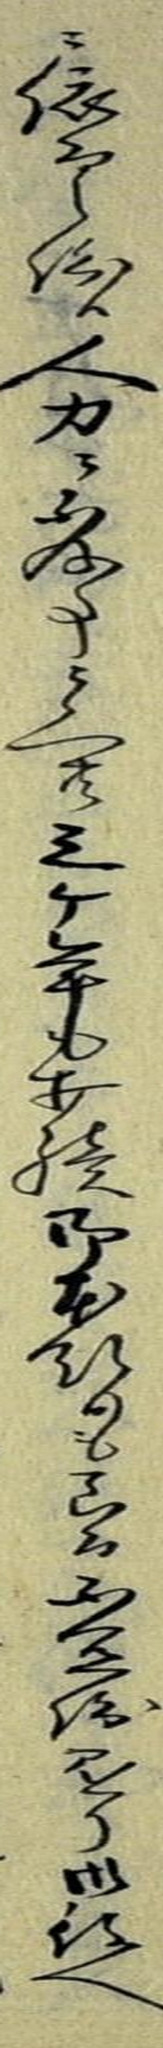に依而之儀は人力に不及事に候へ共三ヶ年も打続御本領ゟも至而不宜儀懸り御役人
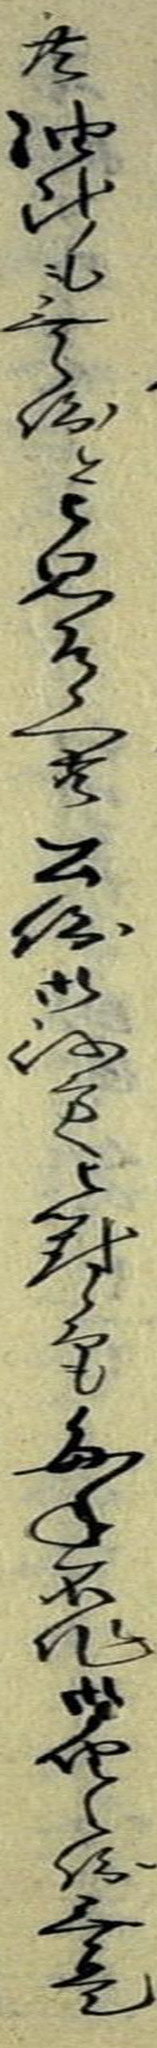共油断も無之儀と被思召候へ共公儀御役方へ被対候而も毎年不作御届之儀無是
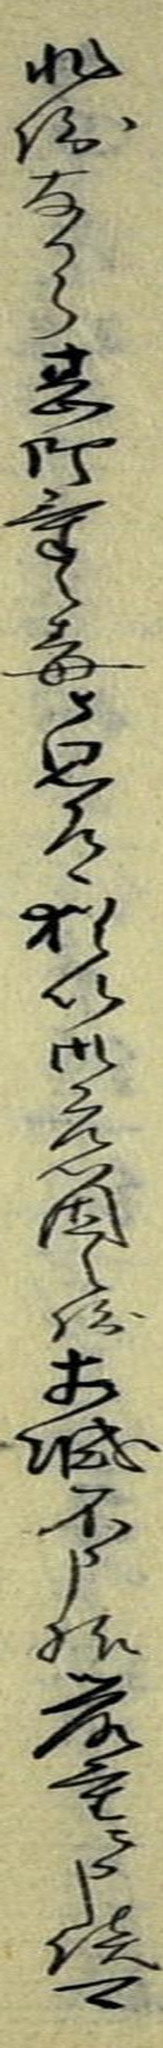非儀なから甚御気之毒被思召候猶以御取箇之儀相減不申様厳重に申談可
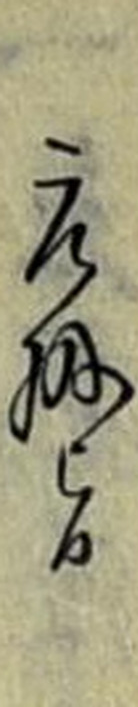取扱旨
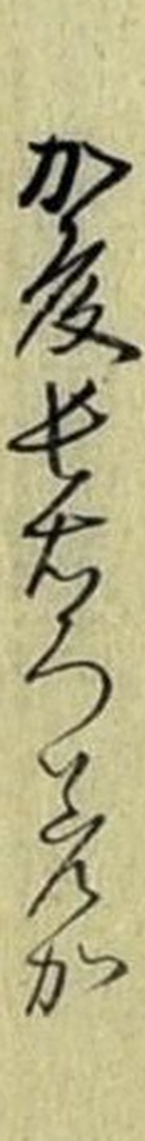加藤長右衛門差加
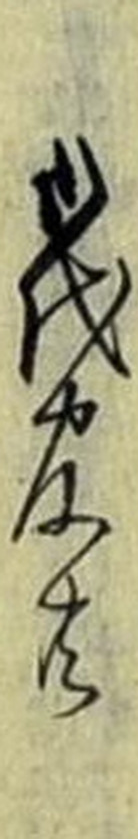御代官共
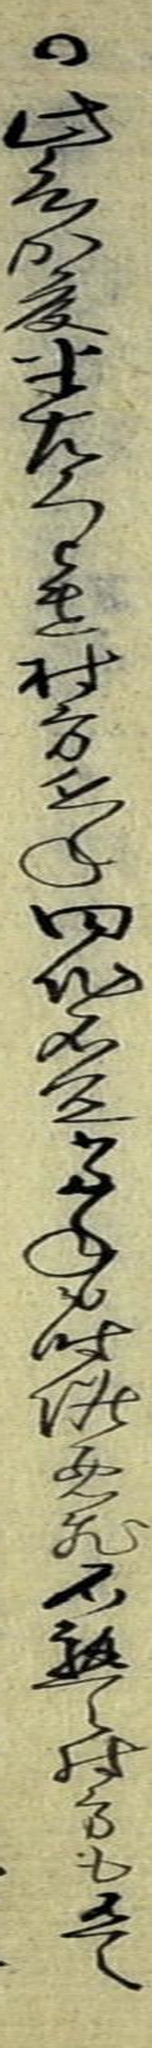〇此度加藤半左衛門被遣村方近年田作不宜当年も時候悪敷不熟之村方も有之
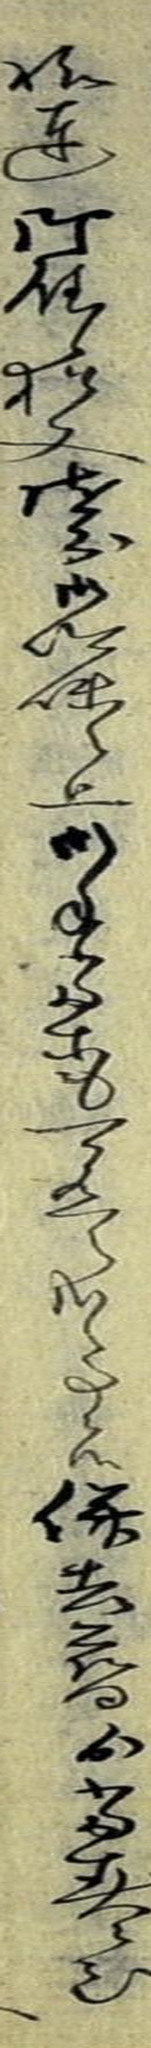様達御聴候猶又随分御吟味之上御手当等も可有之哉事に候併去暮ゟ当春に至
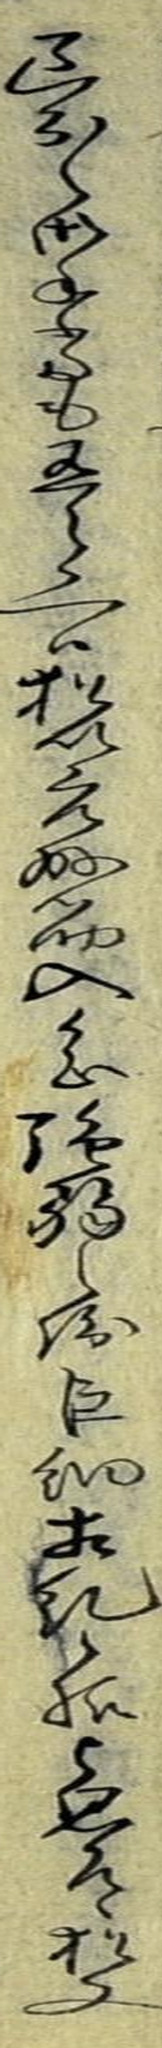過分之御手当も有之候へは猶以取扱筋入念強弱之儀巨細相糺候様被思召候猶又
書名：命令之部 二
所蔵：福井県文書館 Fukui Prefectural Archives
